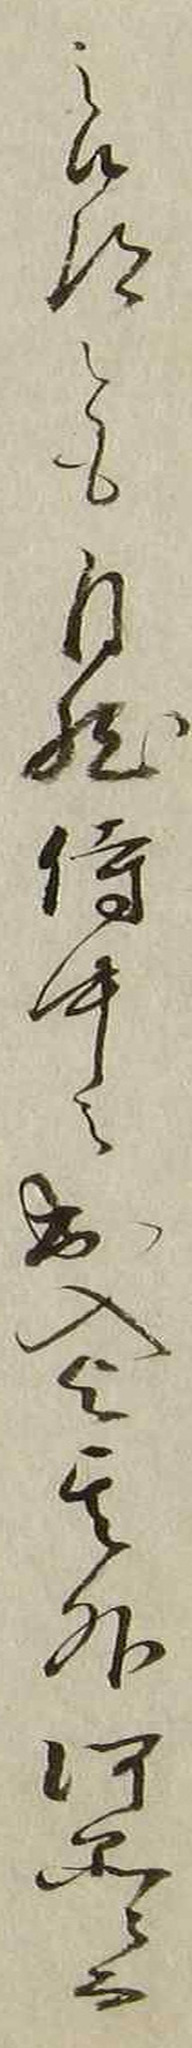之候得とも自然侍中之出入と其外何品にて
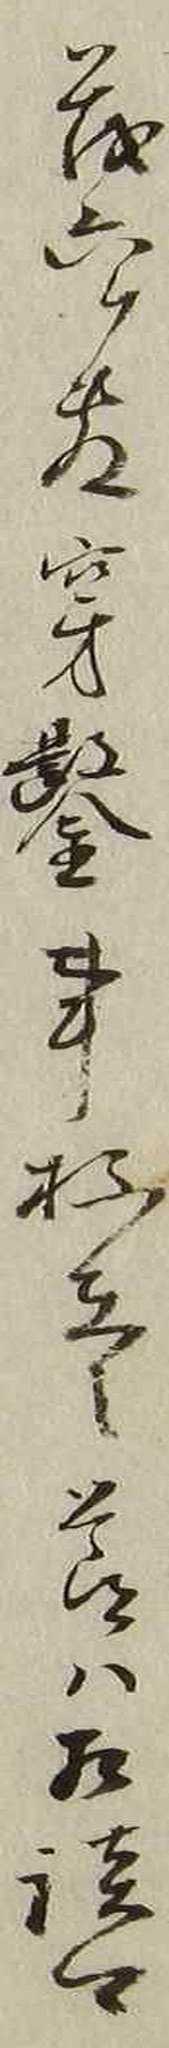も六ヶ敷穿鑿事枚在之節ハ相談可
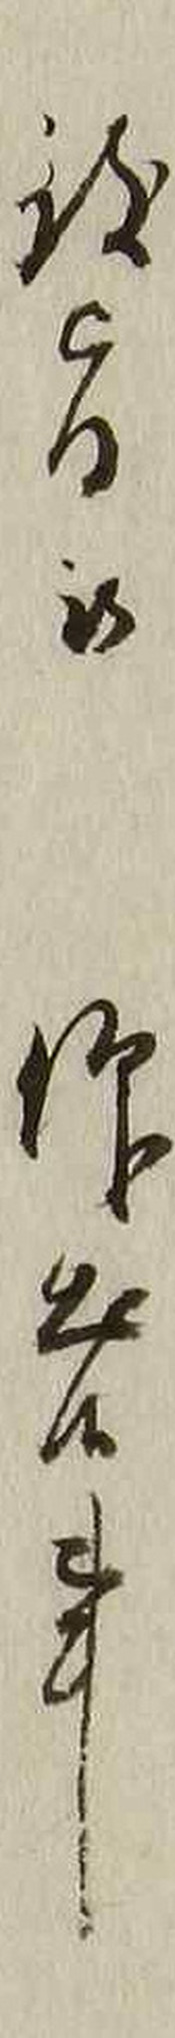致旨被仰出候事
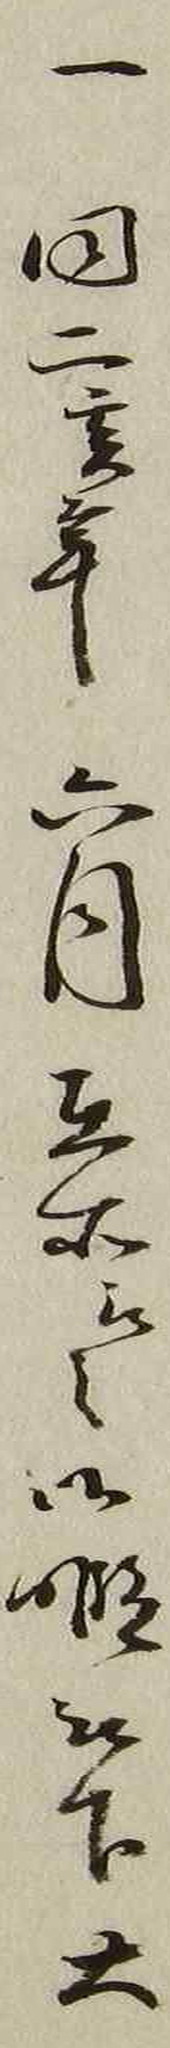一同二亥年六月在所江之御暇被下大
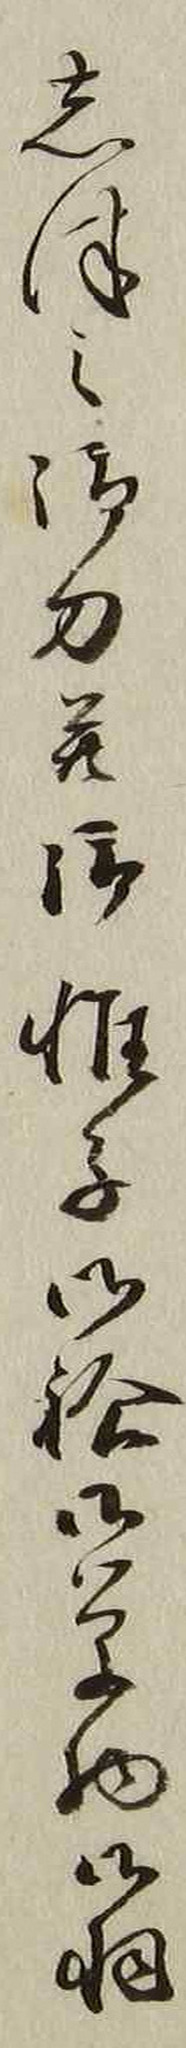志津之御刀并御帷子御袷御単物御羽
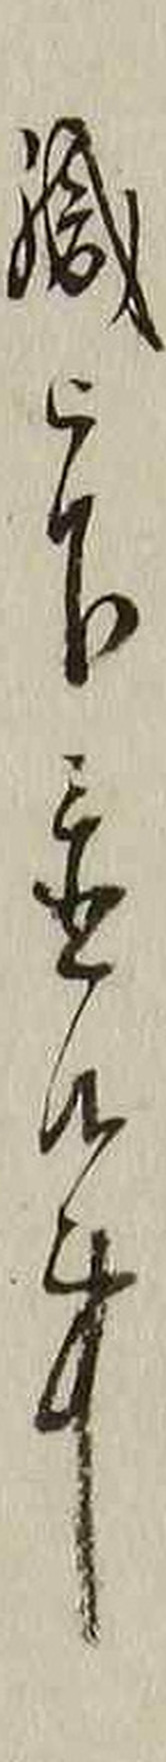織被下置候事
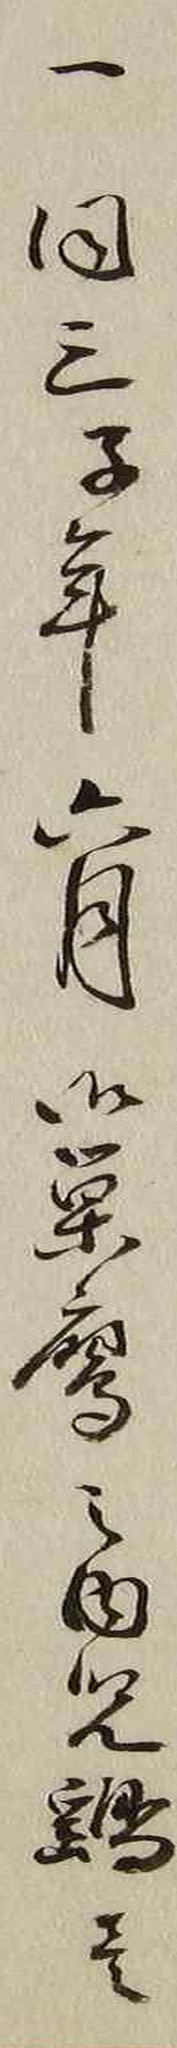一同三子年六月御巣鷹之内児鷂壱
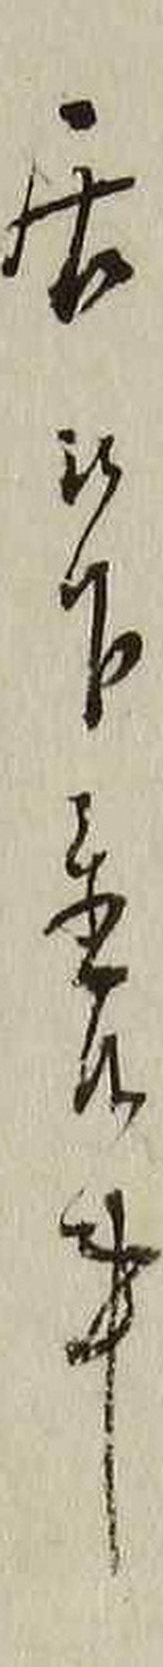居被下置候事
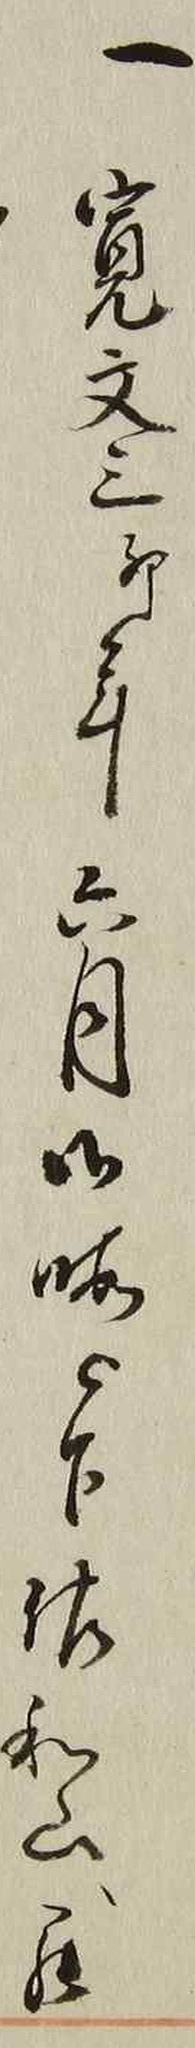一寛文三卯年六月御晦被下佐和山へ罷
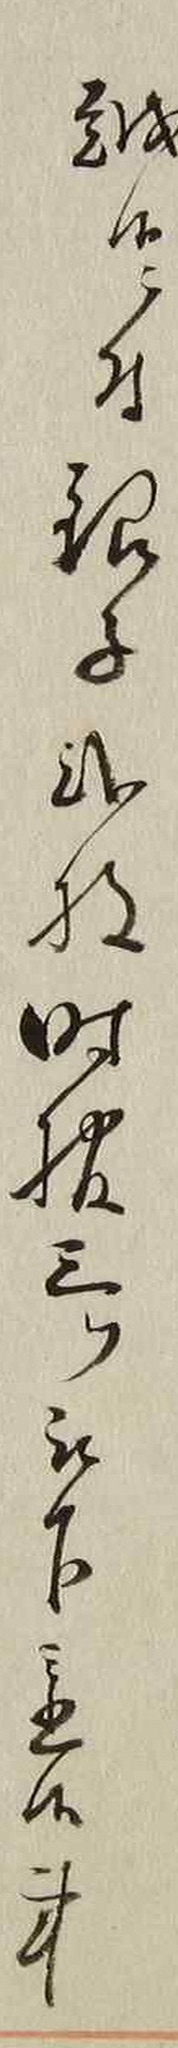越候に付銀子弐枚時服三ツ被下置候事
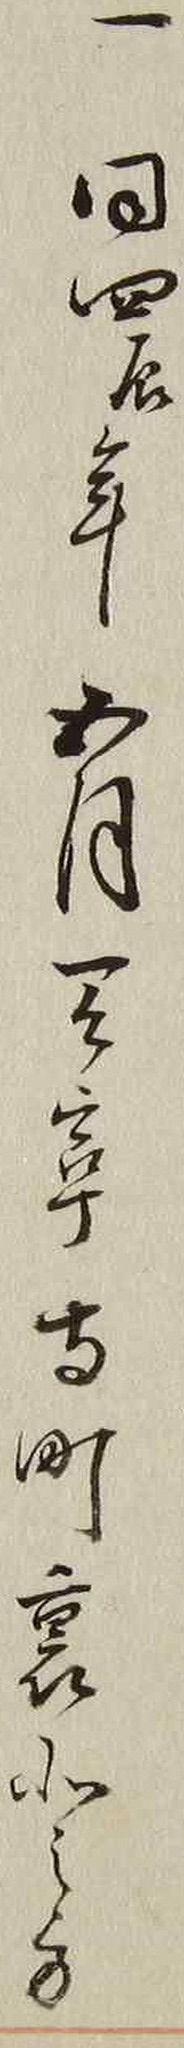一同四辰年五月天寧寺町裏北之方
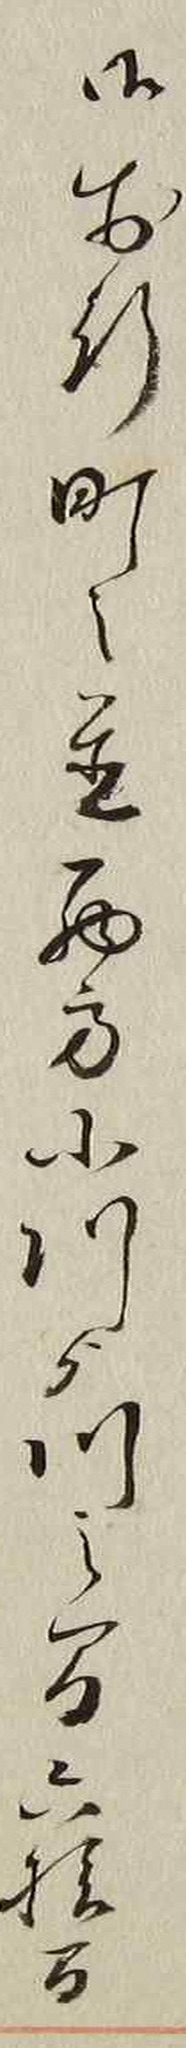御前行町之並西方小川ゟ川之間六拾間
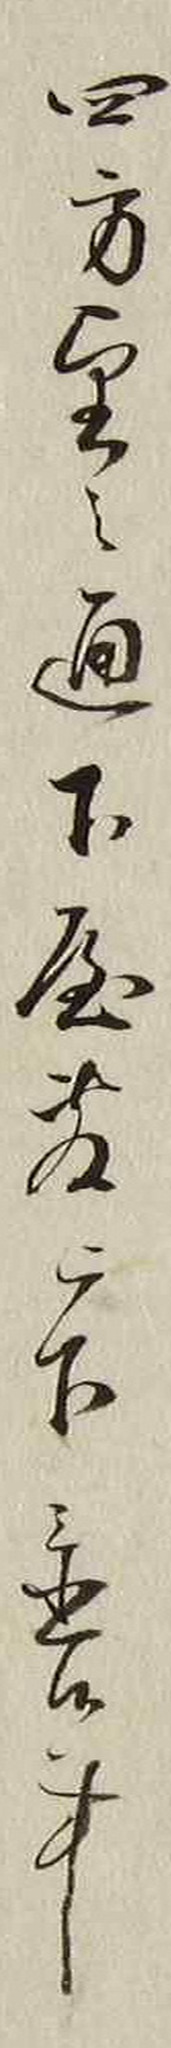四方望之通下屋敷被下置候事
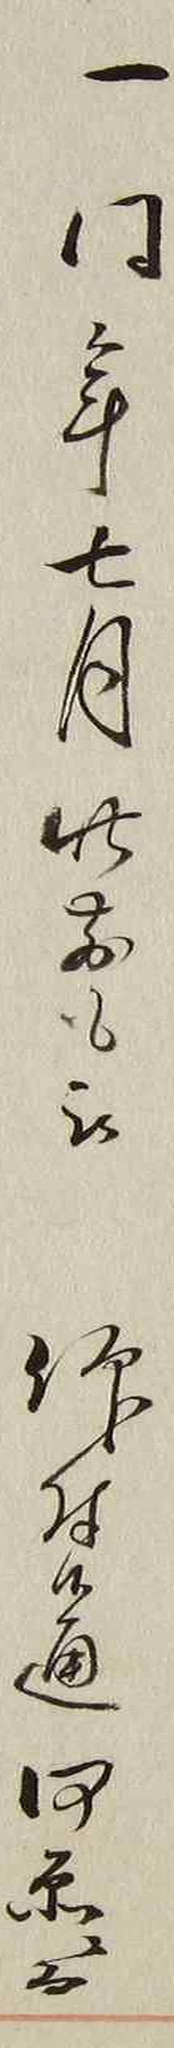一同年七月此前も被仰付候通何品に而
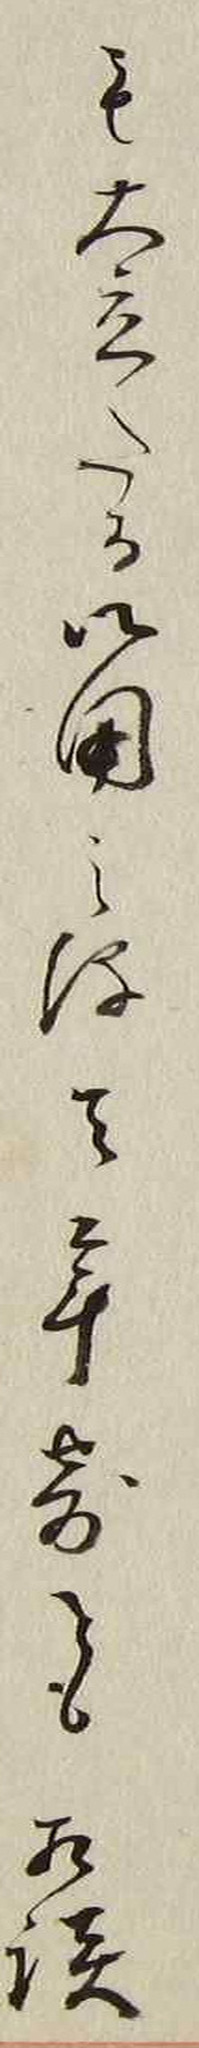も大立たる御用の儀は年寄にも相談
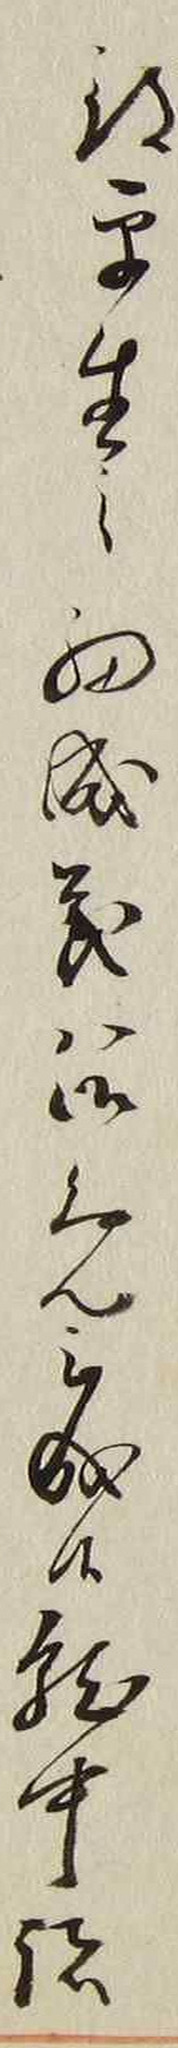致平生之物成義ハ御免被成候就中諸
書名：諸士系譜　巻之159　な之部1
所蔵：会津若松市立会津図書館
